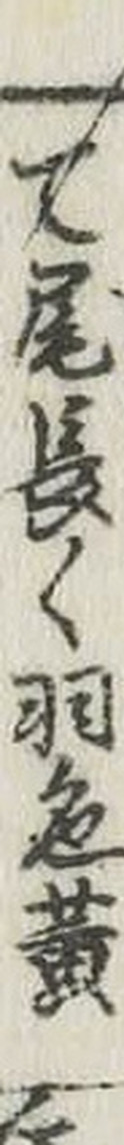て尾長く羽色黄
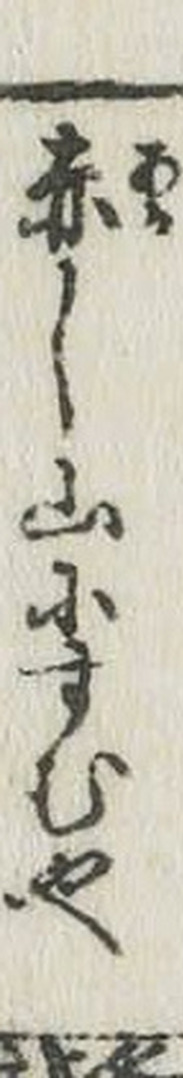赤し山にすむ也
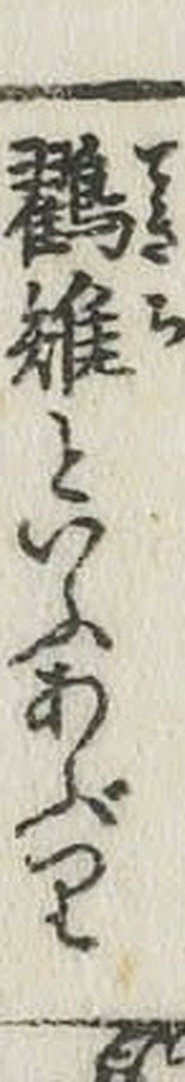鸐雉といふあぶり
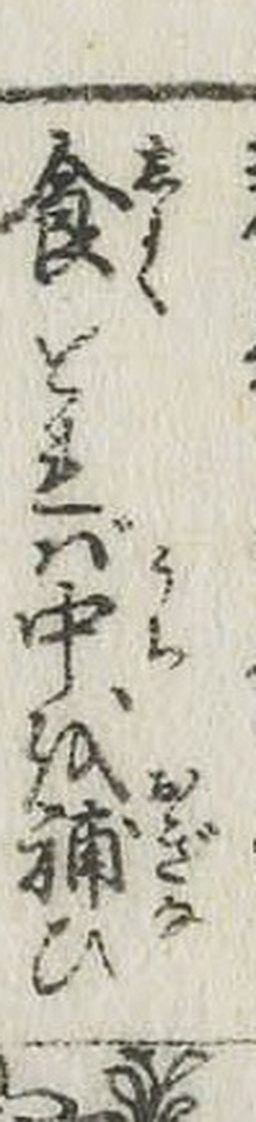食すれば中を補ひ
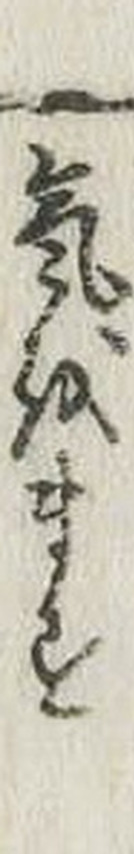気をます
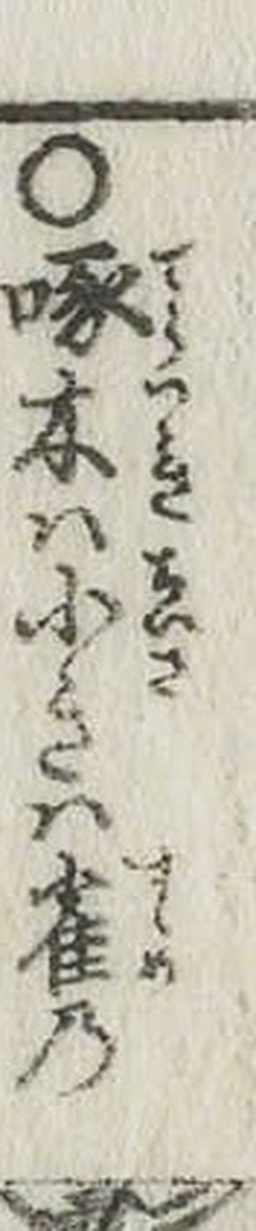○啄木は小きは雀の
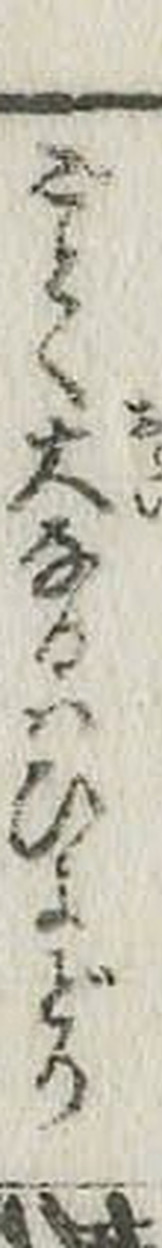ごとく大なるはひよどり
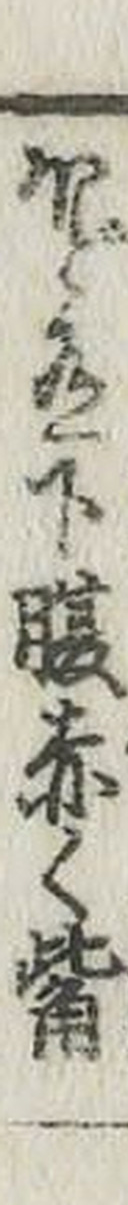ほど有下腹赤く觜
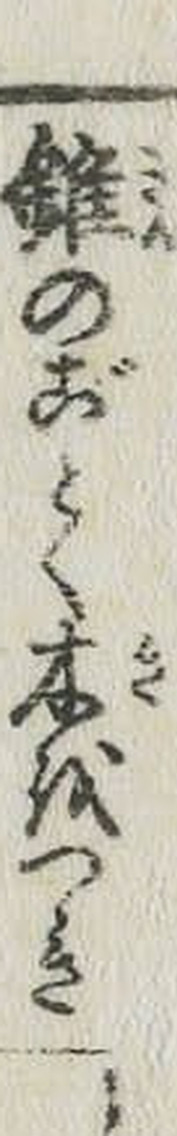錐のごとく木をつゝき
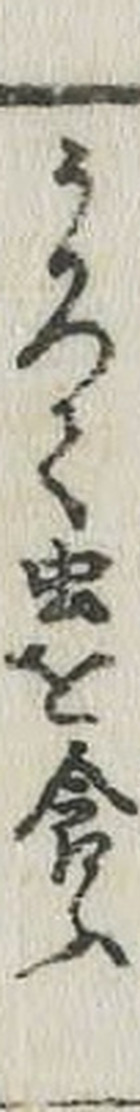うかつて虫を食ふ

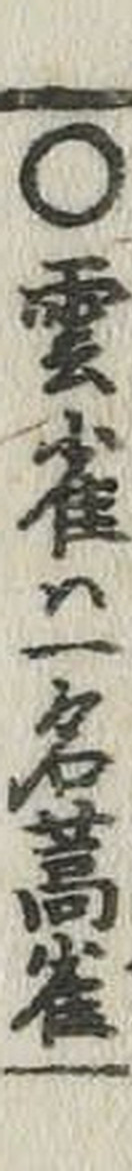○雲雀は一名蒿雀
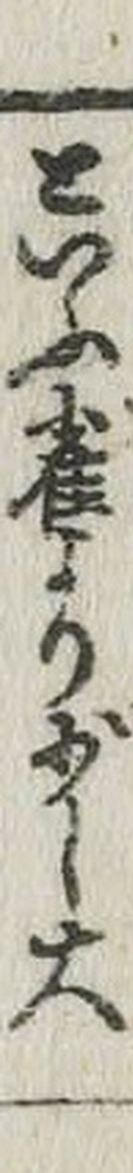といふ雀より少し大
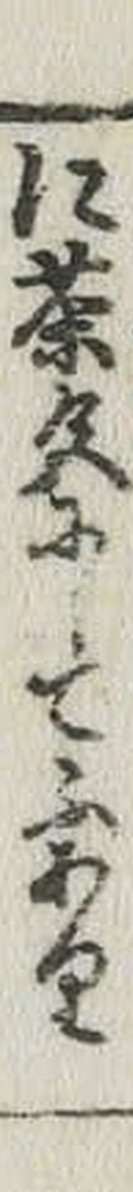に茶色にしてふあり
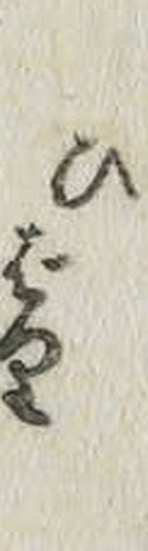ひばり
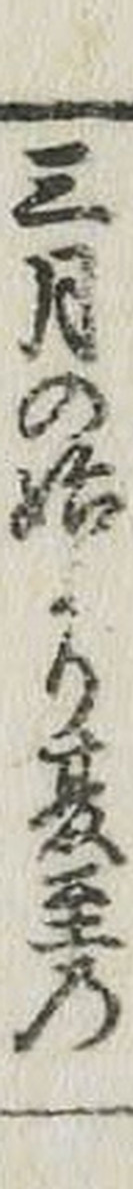三月の始より夏至の
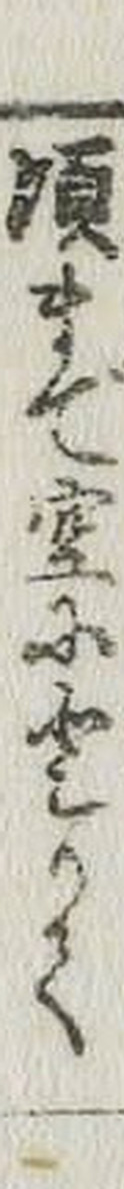頃まで空に登りて
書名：増補頭書訓蒙図彙大成 10巻 6:巻之12-13
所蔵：東京学芸大学教育コンテンツアーカイブ
